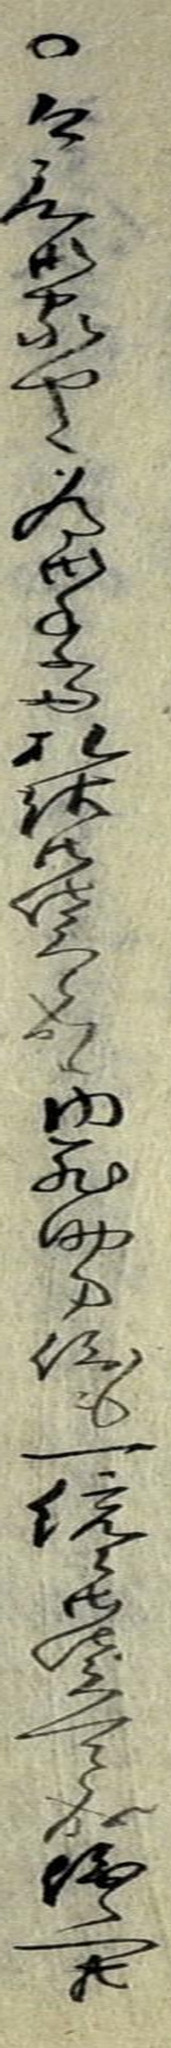〇今度御家中へ為御手当札銀御貸被成候内蔵助方儀も一統ニ御貸可被成儀候へ共
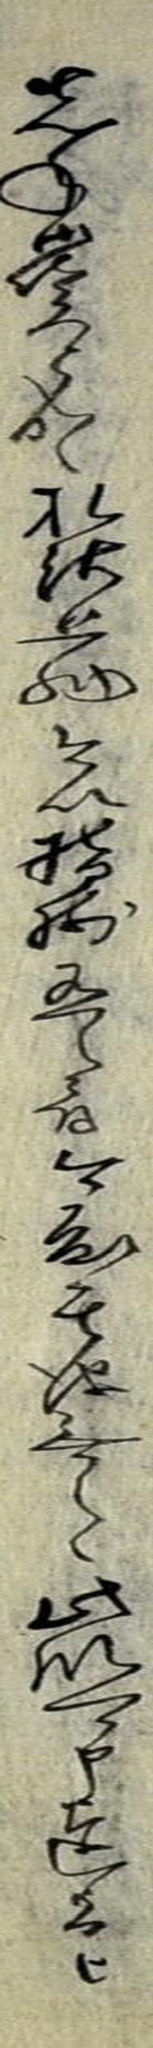先年御貸被成候札銀上納今以指残有之ニ付今度其儀無之候此段可申達旨被
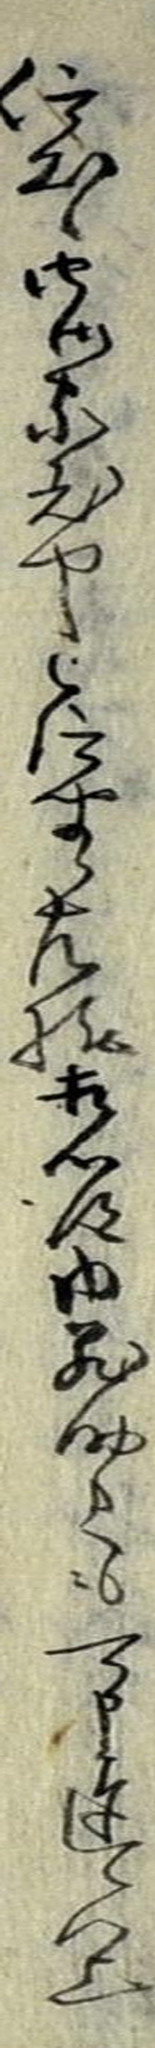仰出候由御家老中被仰聞候左様相心得内蔵助方へも可申達候以上
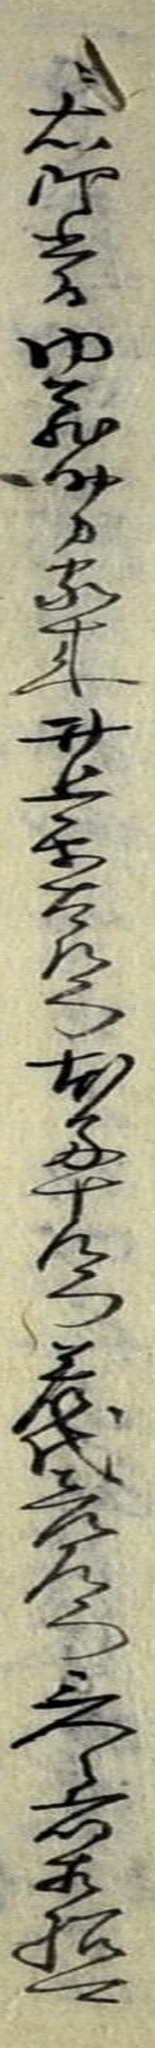右御書付内蔵助方家来井上平太左衛門本多十左衛門代彦左衛門三人之者相招可
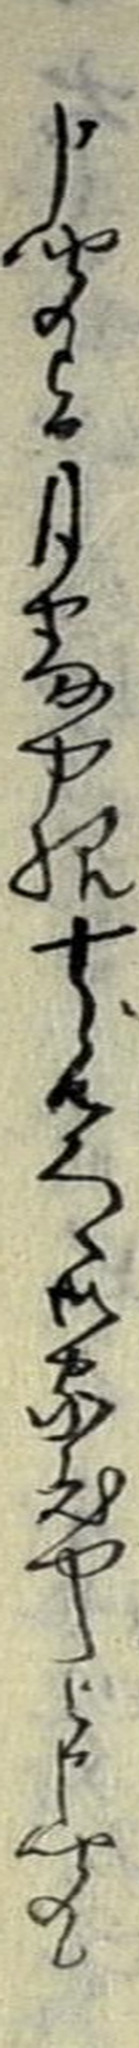申聞旨月番中根十郎左衛門へ御家老中被申聞候
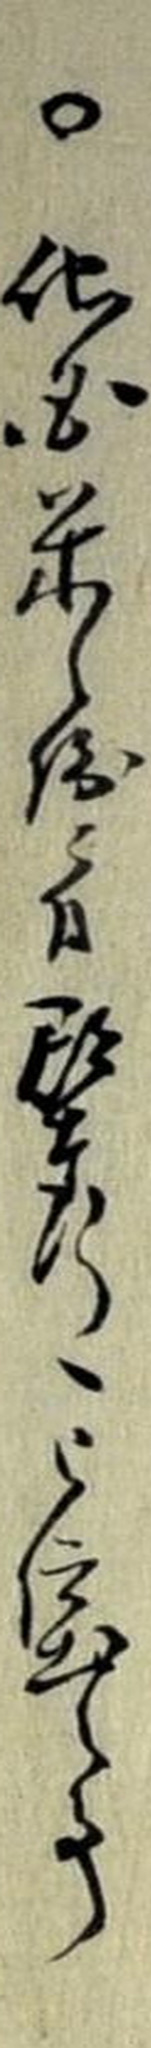〇他国米之儀ニ付郡奉行へ被仰出候事
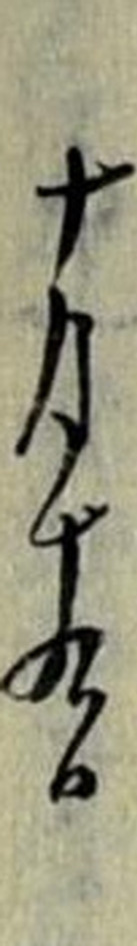十月十九日
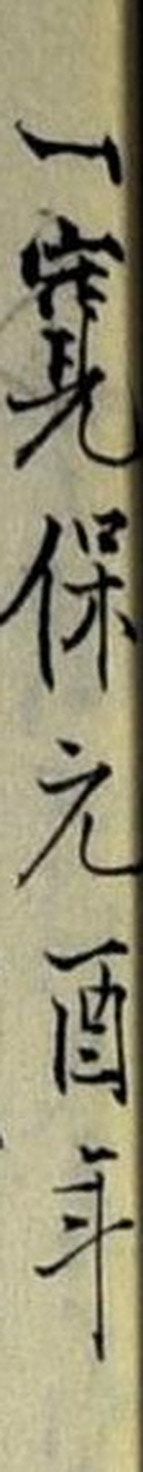一寛保元酉年
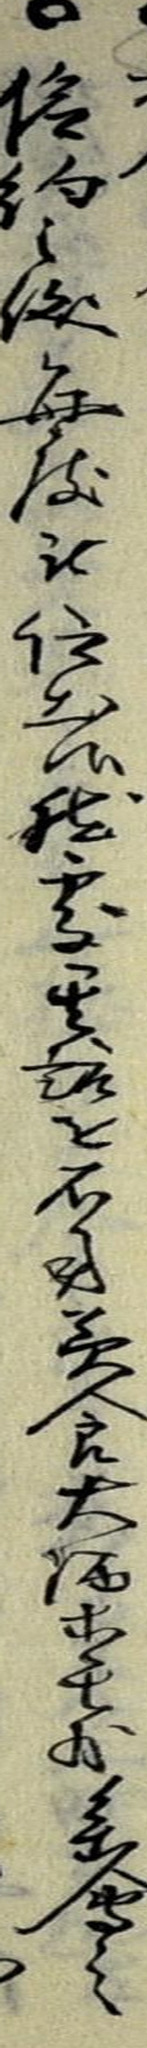〇倹約之儀毎度被仰出候然処其趣を不用美食大酒等其外参会之
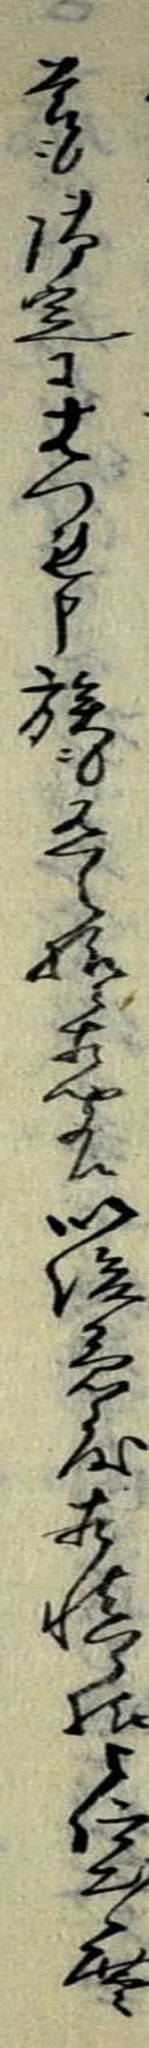節も御定にはつれ申族も有之候様ニ相聞候以後急度相慎候様被仰出候面々
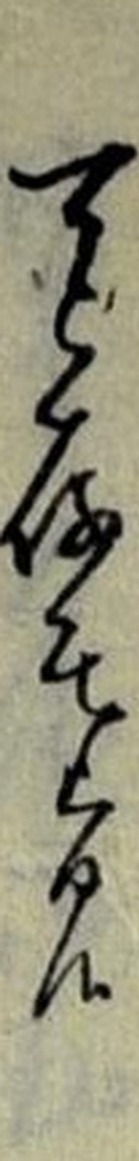可被存其旨候
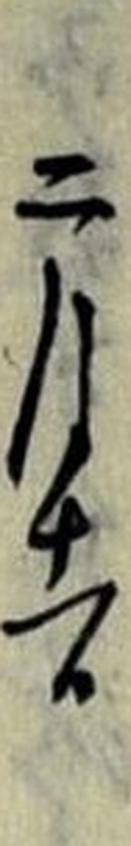二月十一日
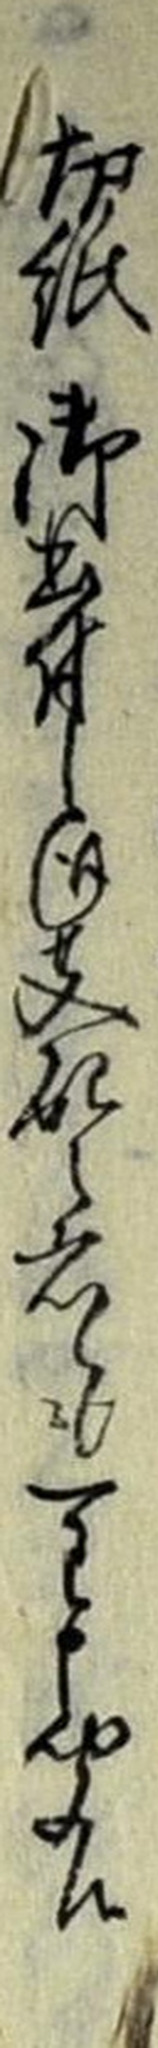切紙御書付之趣支配之者へも可被申聞候
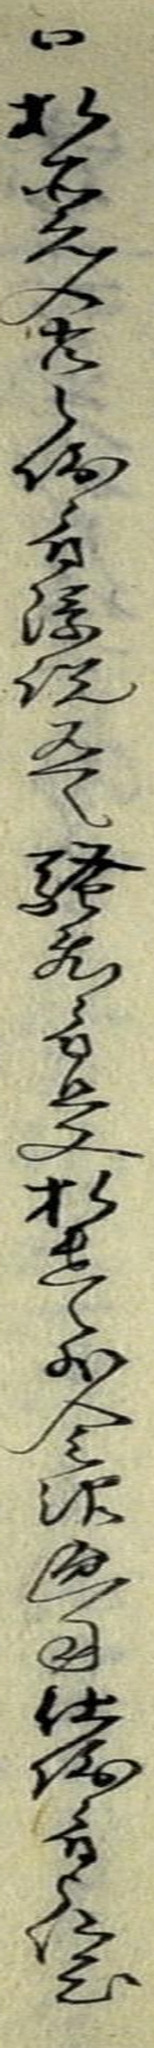〇札所元〆共之儀ニ付浮説有之騒敷ニ付且又札遣之外金沢通用仕儀ニ付被仰出
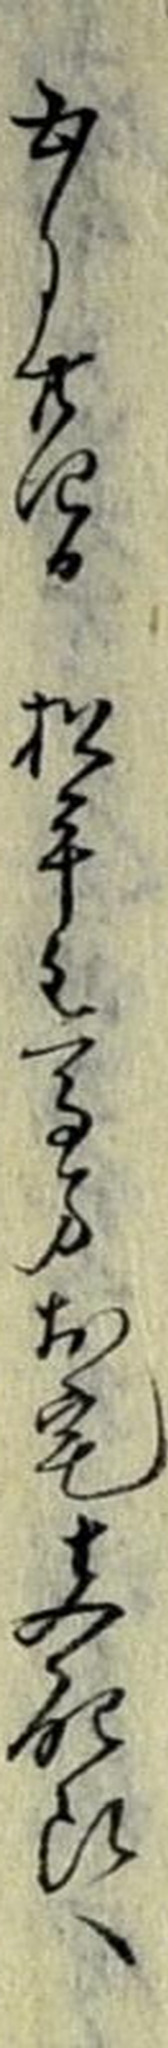五月廿四日松平主馬方於宅支配頭へ
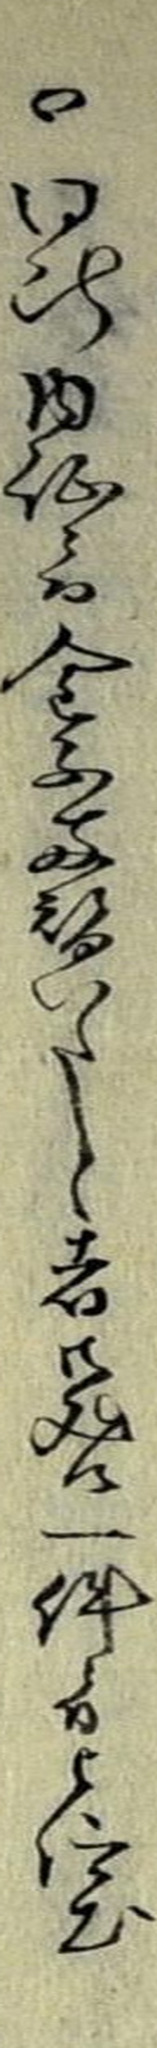〇同断内証ニ而金子両替いたし候者御咎一件ニ付被仰出
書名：命令之部 一
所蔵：福井県文書館 Fukui Prefectural Archives
